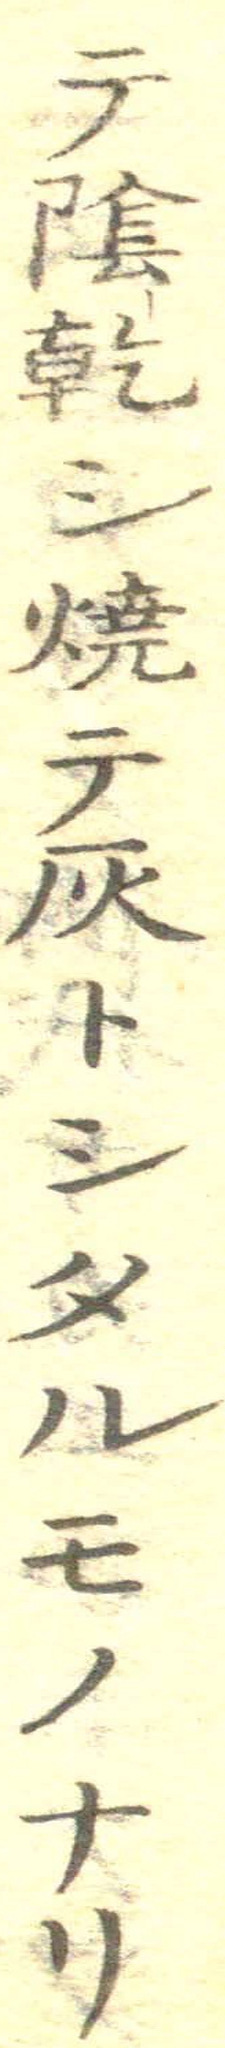テ陰-乾シ焼テ灰トシタルモノナリ
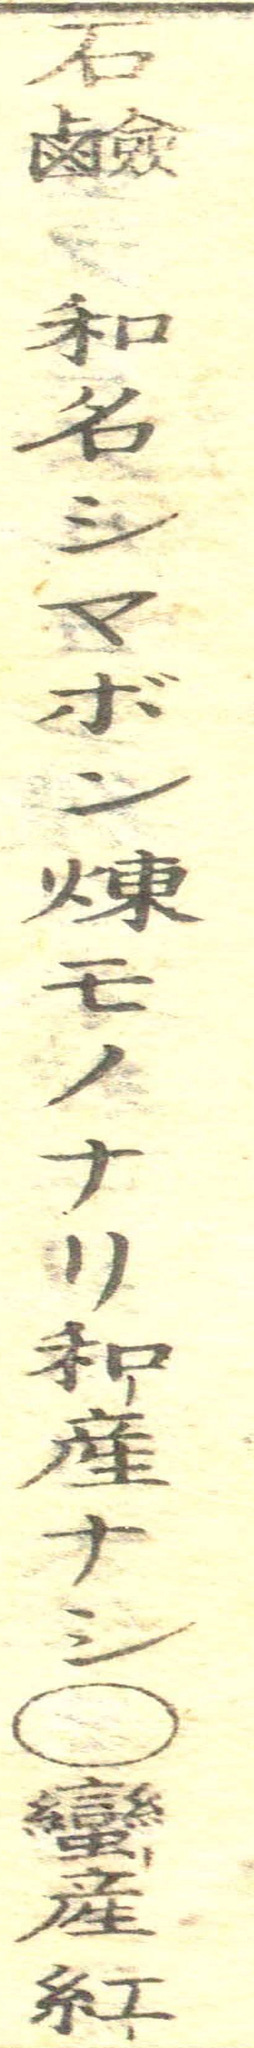石鹸和名シヤボン煉モノナリ和産ナシ○蛮-産紅-
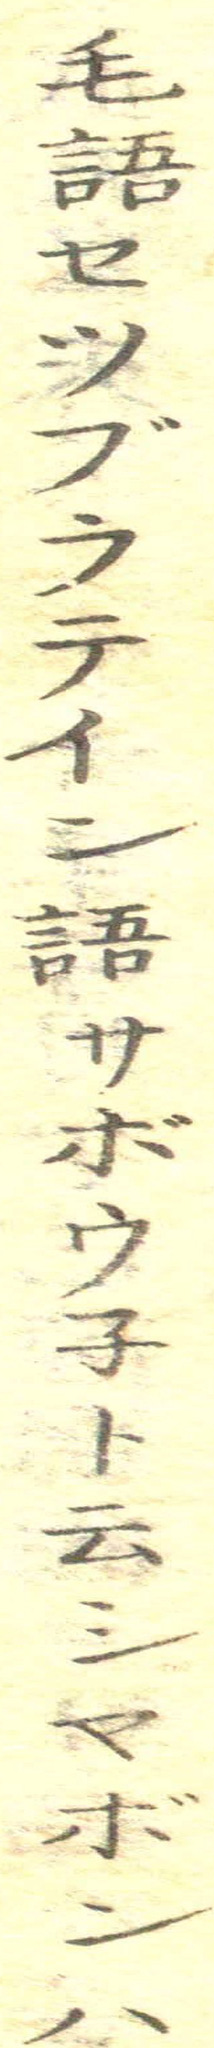毛語セツブラテイン語サボウネト云シヤボンハ
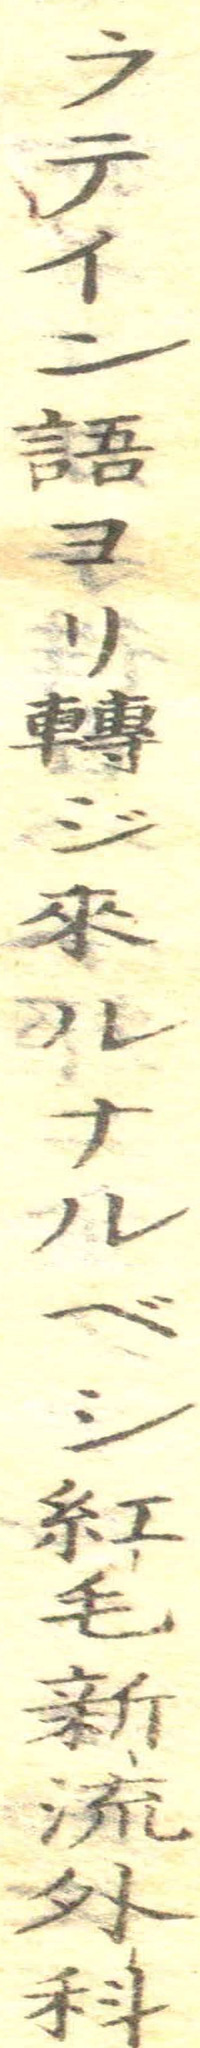ラテイン語ヨリ転ジ来ルナルベシ紅-毛新-流外-科
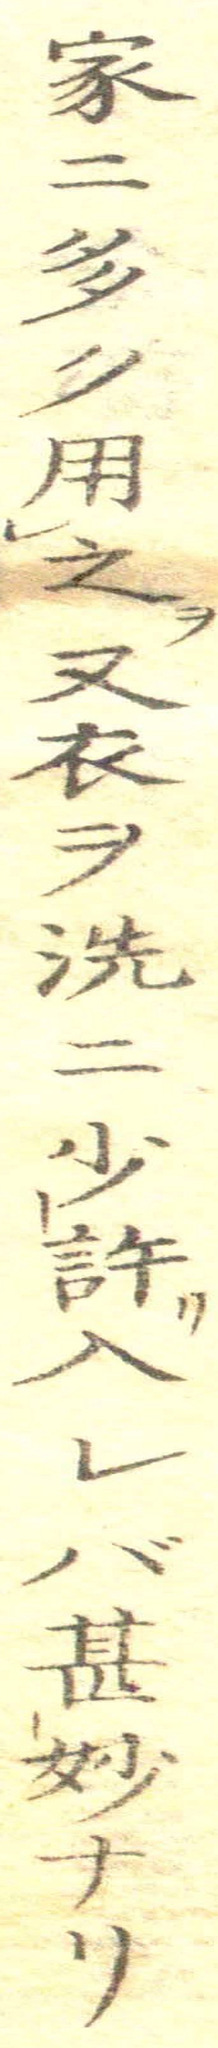家ニ多ク用之又衣ヲ洗ニ少-許入レバ甚-妙ナリ

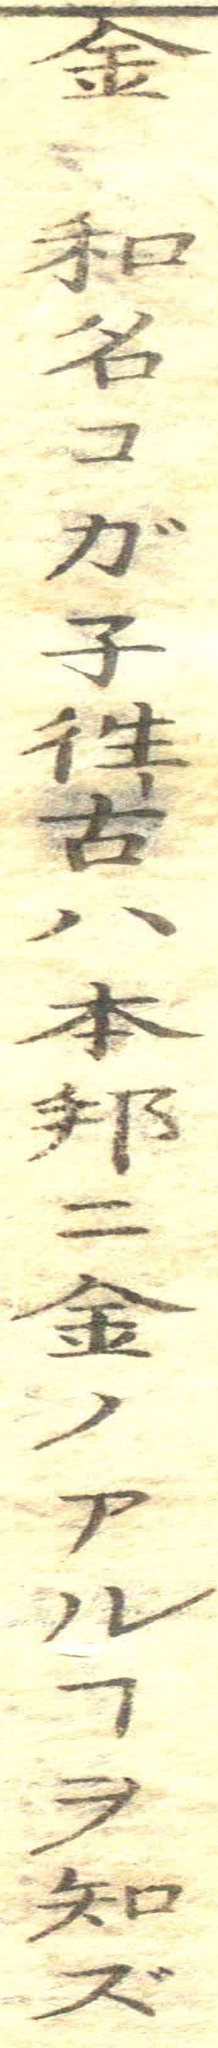金和名コガネ往-古ハ本邦ニ金ノアルコトヲ知ズ
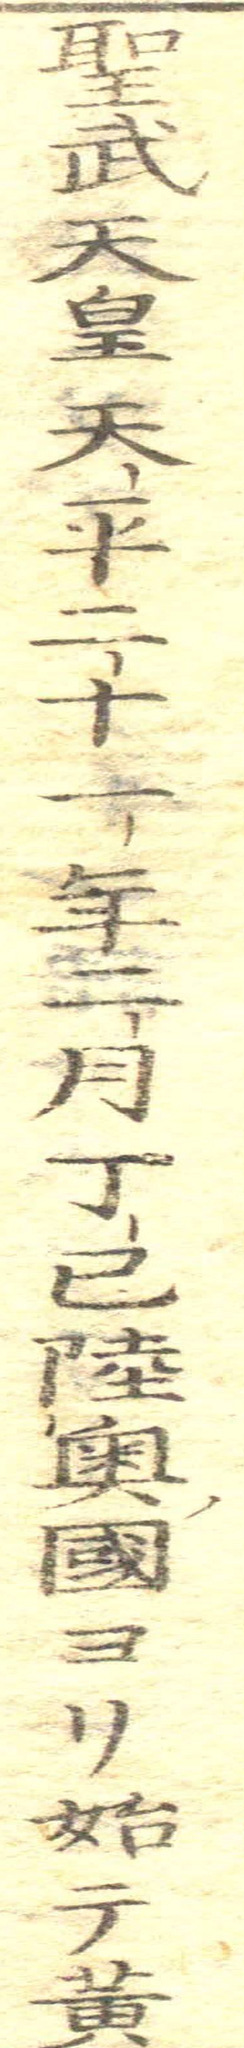聖武天皇天-平二-十一-年二-月丁-巳陸-奥国ヨリ始テ黄
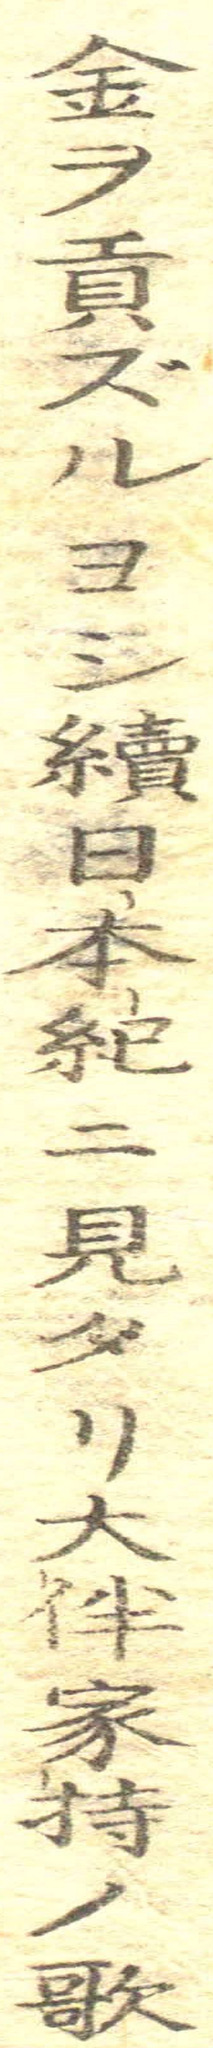金ヲ貢ズルヨシ続-日-本-紀ニ見タリ大伴家持ノ歌
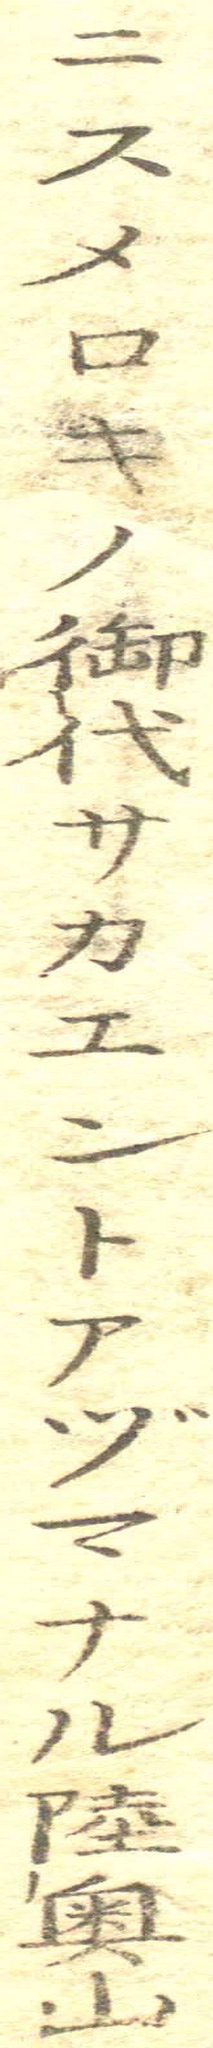ニスメロキノ御-代サカエントアヅマナル陸奥山
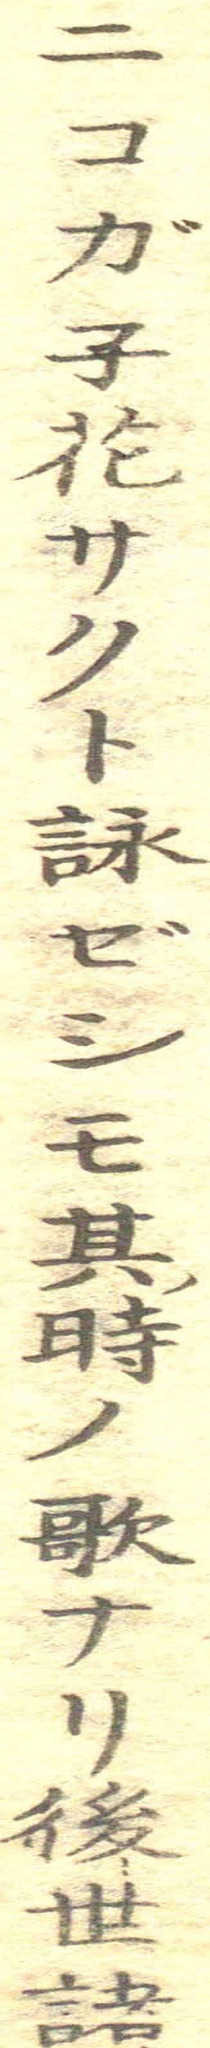ニコガネ花サクト詠ゼシモ其時ノ歌ナリ後-世語-
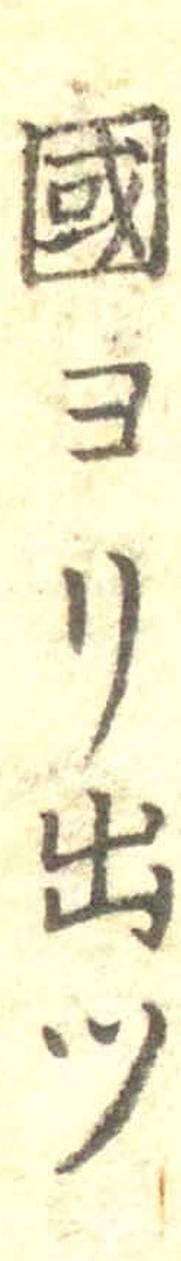国ヨリ出ツ
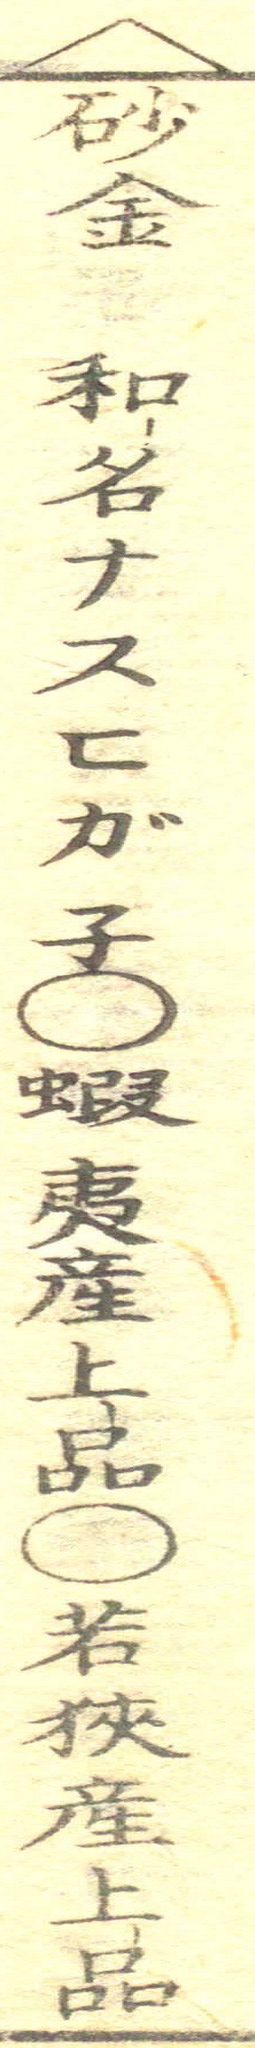△砂金和-名ナスヒガネ○蝦夷産上-品○若狭産上-品
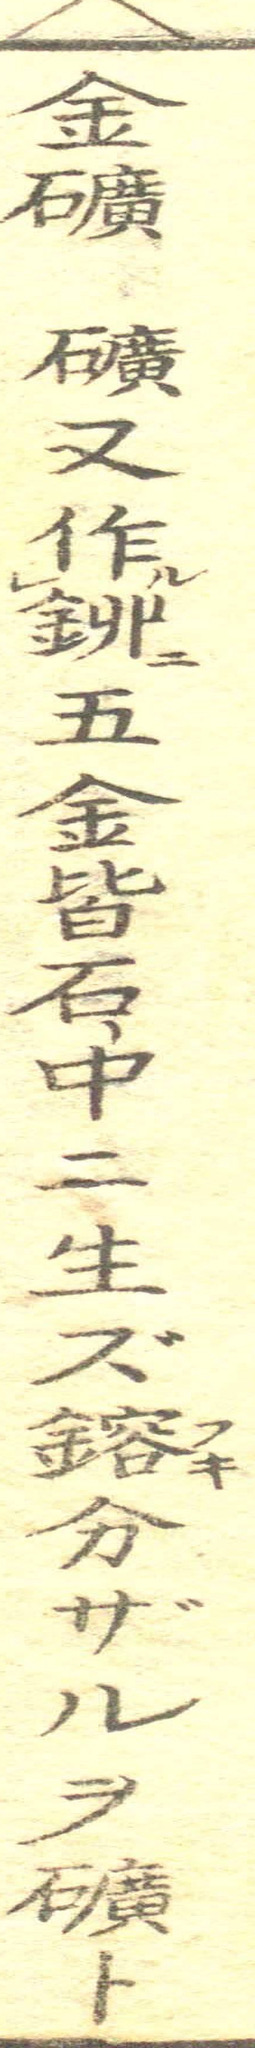△金礦礦又作鉱五金皆石-中ニ生ズ鎔分ザルヲ礦ト
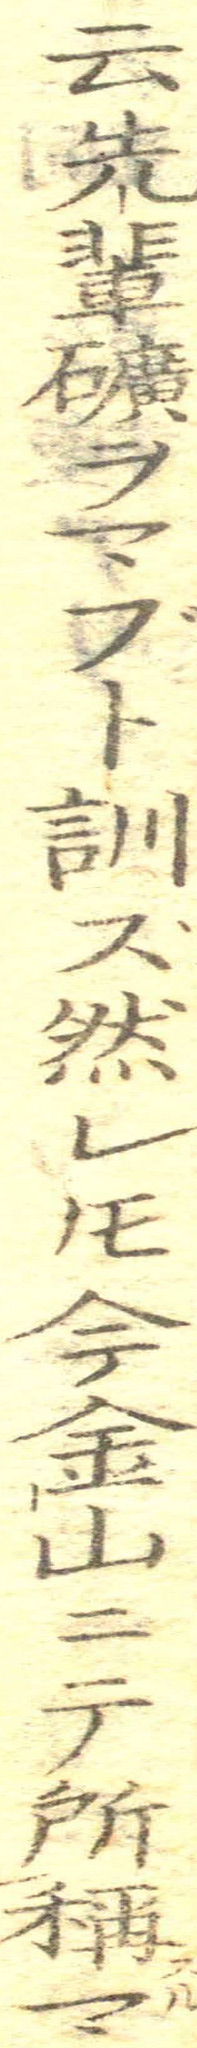云先輩礦ヲマブト訓ズ然レトモ今金-山ニテ所称
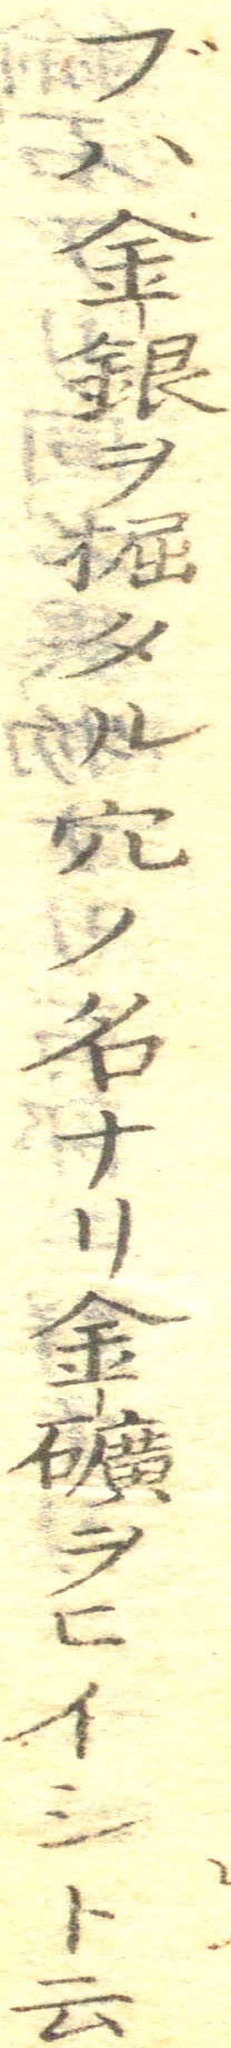ブハ金-銀ヲ掘タル穴ノ名ナリ金-礦ヲヒイシト云
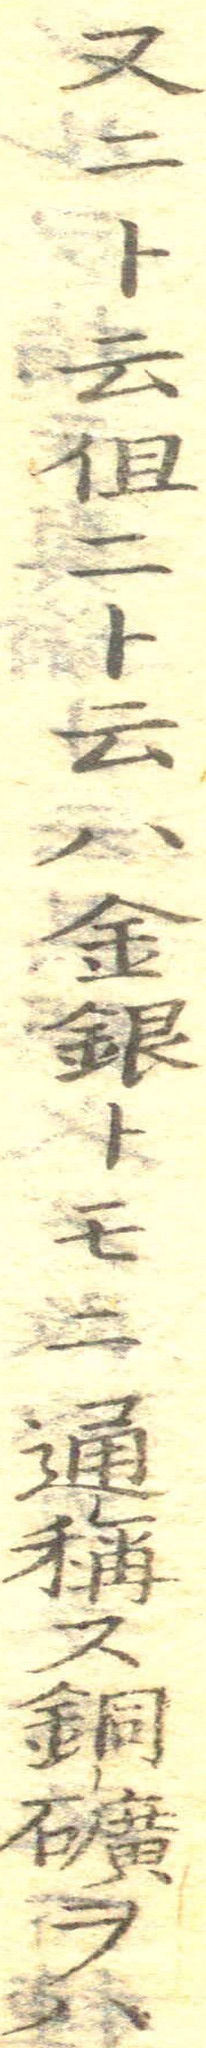又ニト云但二ト云ハ金銀トモニ通称ス銅礦ヲハ
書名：物類品隲
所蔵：国文学研究資料館
